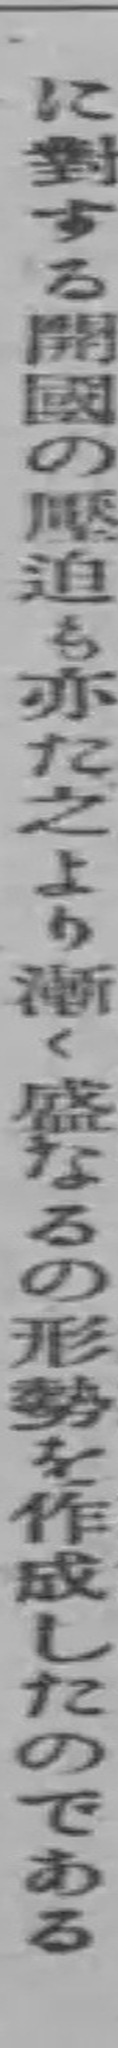に対する開国の圧迫も亦た之より漸く盛なるの形勢を作成したのである
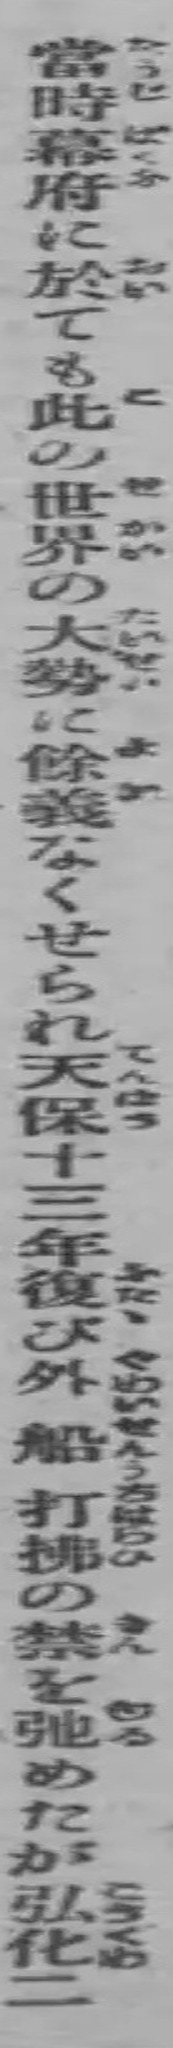当時幕府に於ても此の世界の大勢に余儀なくせられ天保十三年復び外船打払の禁を弛めたが弘化二
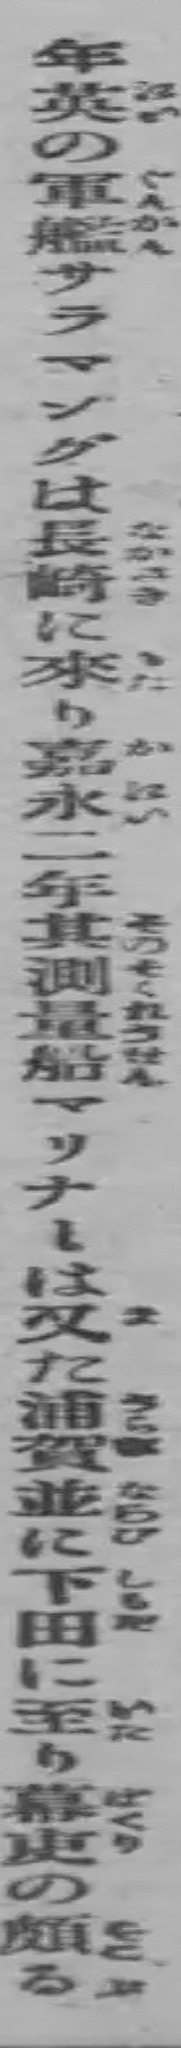年英の軍艦サラマングは長崎に来り嘉永二年其測量船マリナーは又た浦賀並に下田に至り幕吏の頗る
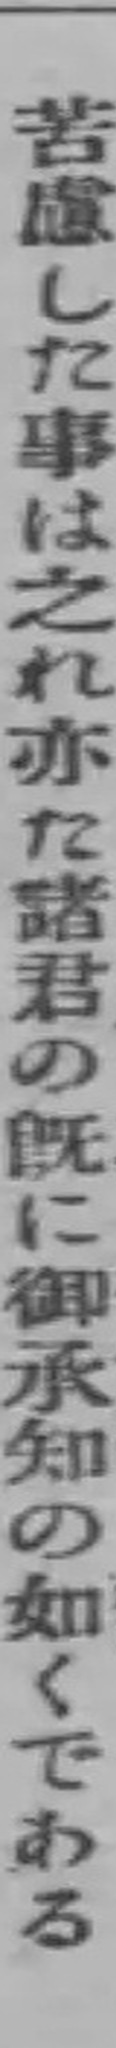苦慮した事は之れ亦た諸君の既に御承知の如くである
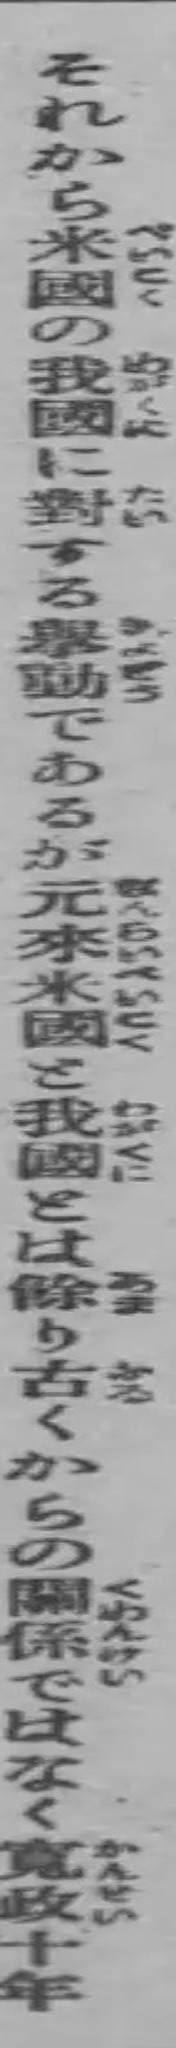それから米国の我国に対する挙動であるが元来米国と我国とは余り古くからの関係ではなく寛政十年
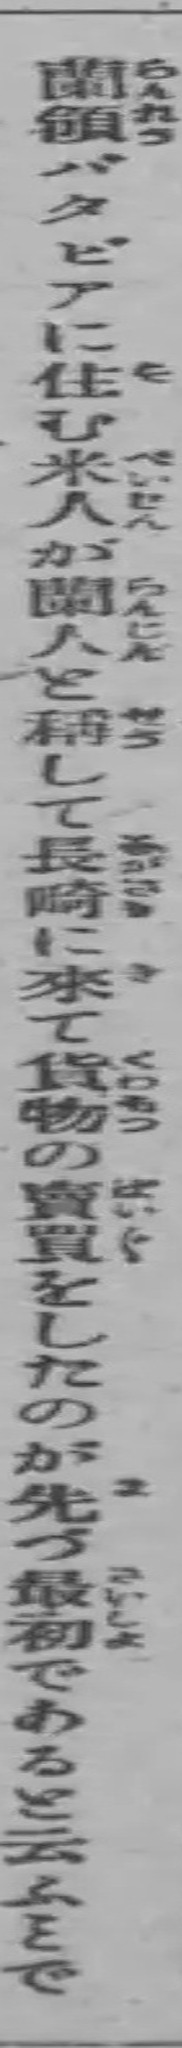蘭領バタビアに住む米人が蘭人と称して長崎に来て貨物の売買をしたのが先づ最初であると云ふことで
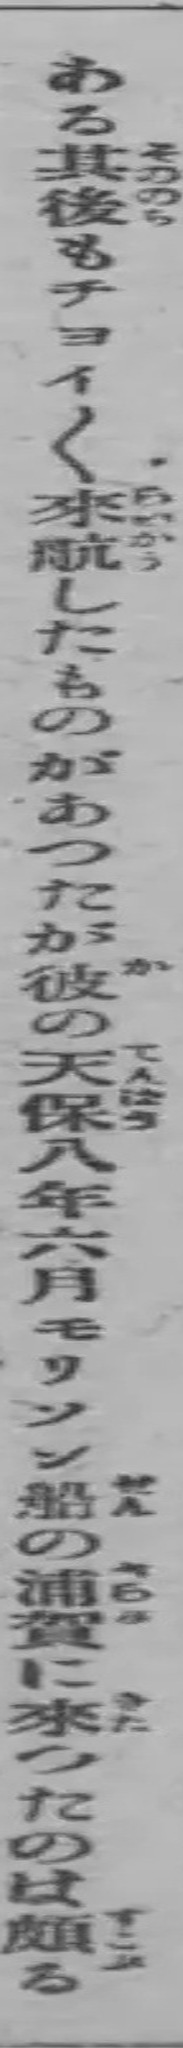ある其後もチヨイ〳〵来航したものがあつたが彼の天保八年六月モリソン船の浦賀に来つたのは頗る
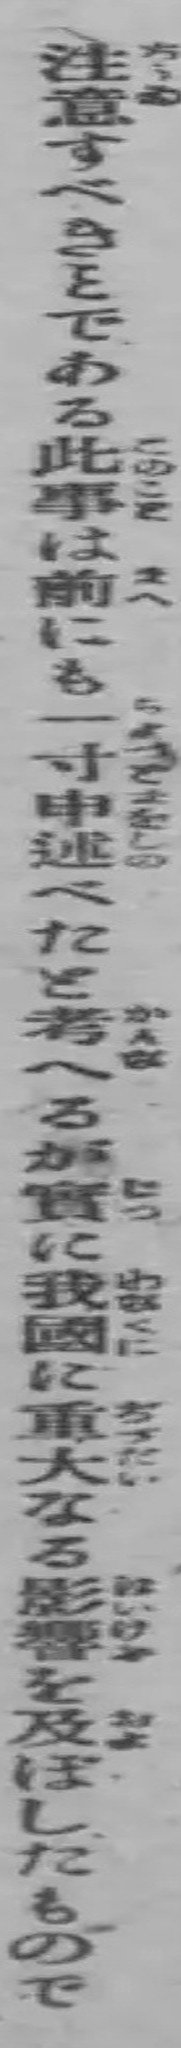注意すべきことである此事は前にも一寸申述べたと考へるが実に我国に重大なる影響を及ぼしたもので
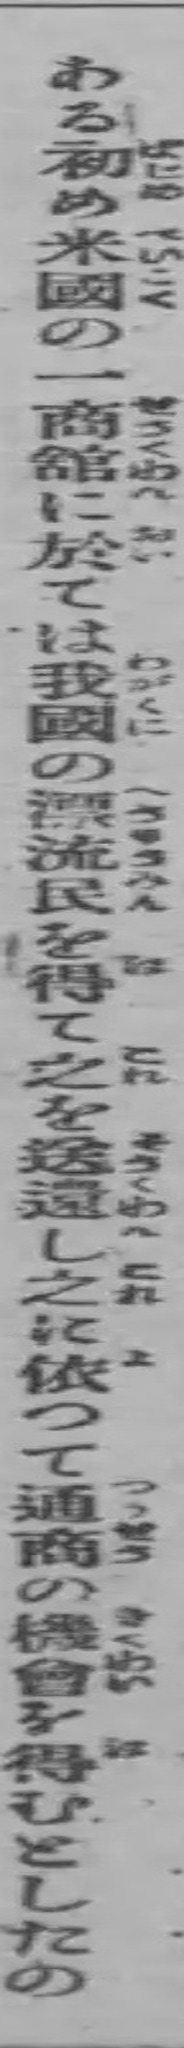ある初め米国の一商館に於ては我国の漂流民を得て之を送還し之に依つて通商の機会を得むとしたの
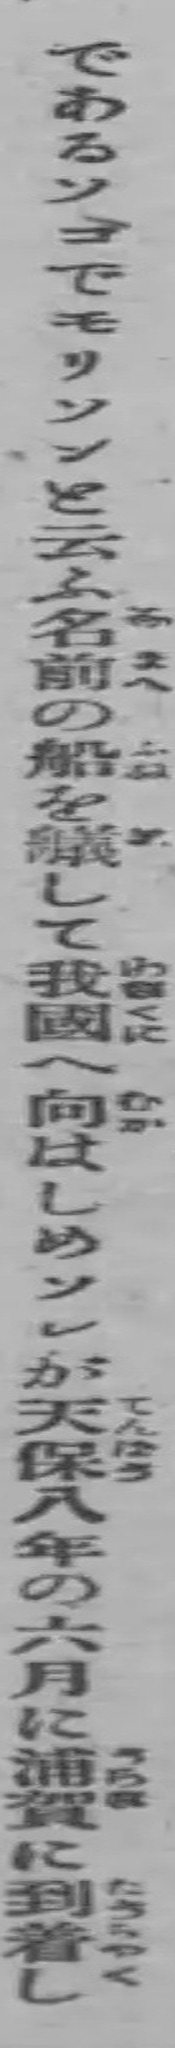であるソコでモリソンと云ふ名前の船を艤して我国へ向はしめソレが天保八年の六月に浦賀に到着し
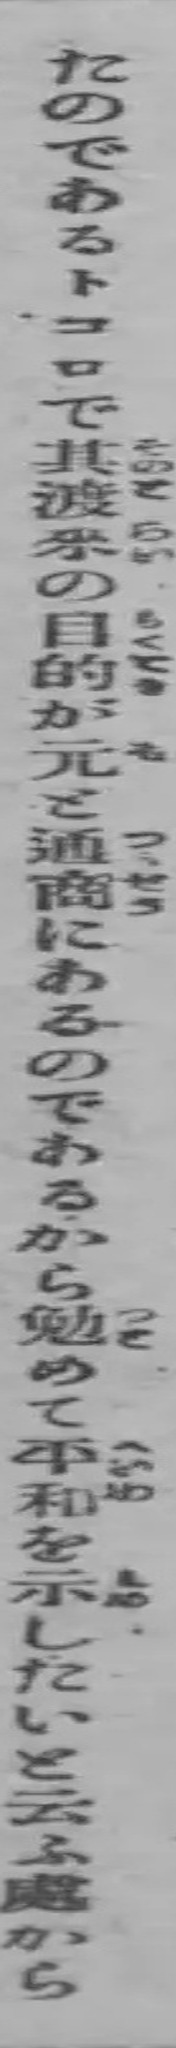たのであるトコロで其渡来の目的が元と通商にあるのであるから勉めて平和を示したいと云ふ処から
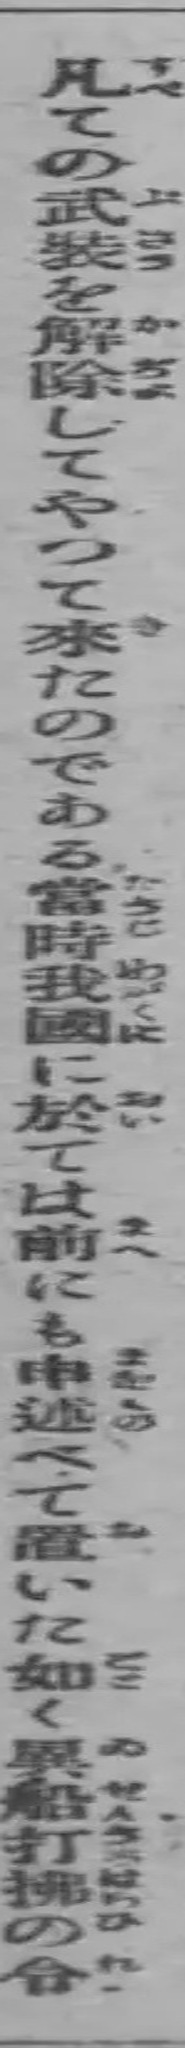凡ての武装を解除してやつて来たのである当時我国に於ては前にも申述べて置いた如く異船打払の令

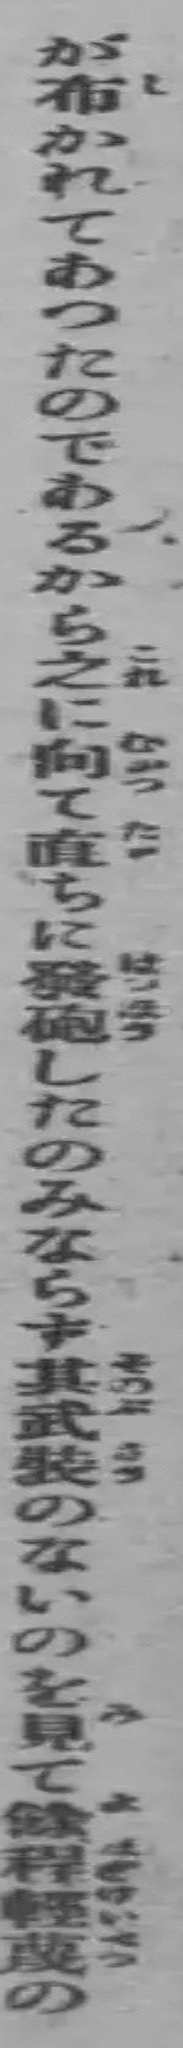が布かれてあつたのであるから之に向て直ちに発砲したのみならず其武装のないのを見て余程軽蔑の
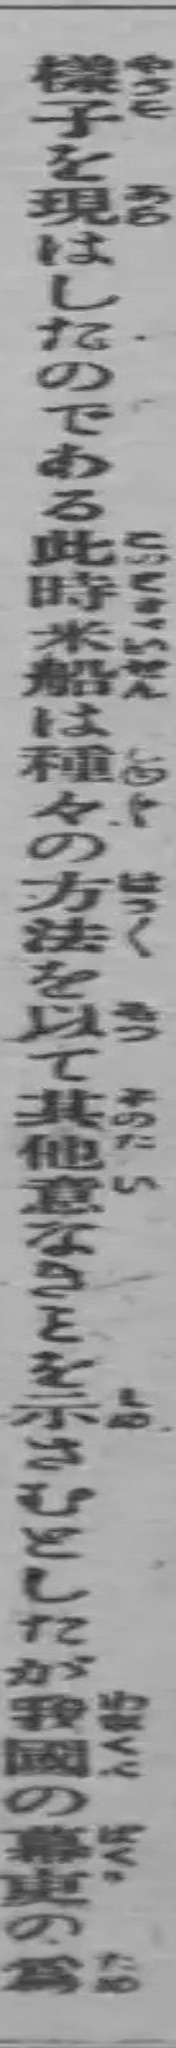様子を現はしたのである此時米船は種々の方法を以て其他意なきことを示さむとしたが我国の幕吏の為
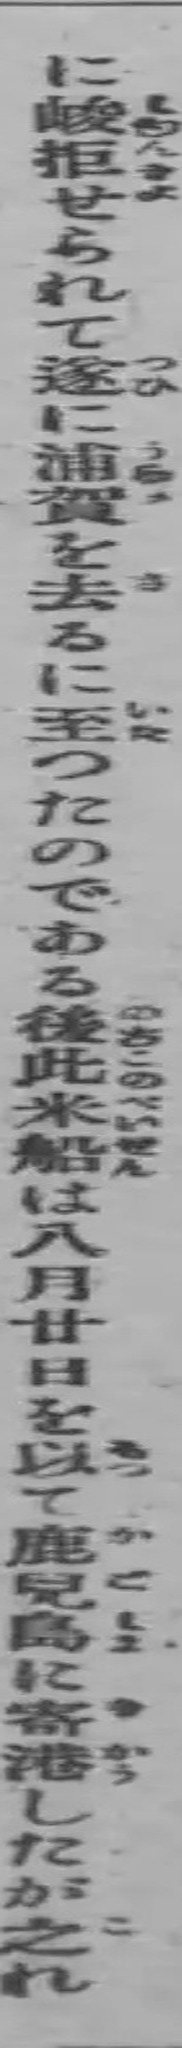に峻拒せられて遂に浦賀を去るに至つたのである後此米船は八月廿日を以て鹿児島に寄港したが之れ
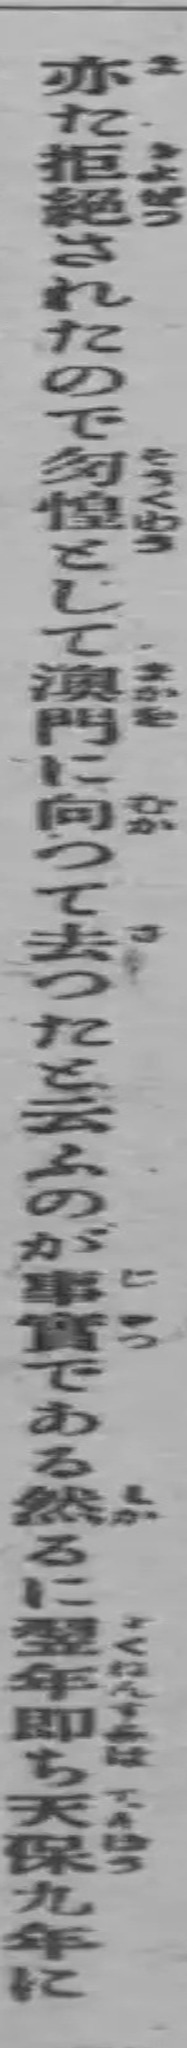亦た拒絶されたので匇惶として澳門に向つて去つたと云ふのが事実である然るに翌年即ち天保九年に
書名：豊橋市史談
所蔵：国立国会図書館 National Diet Library, JAPAN
